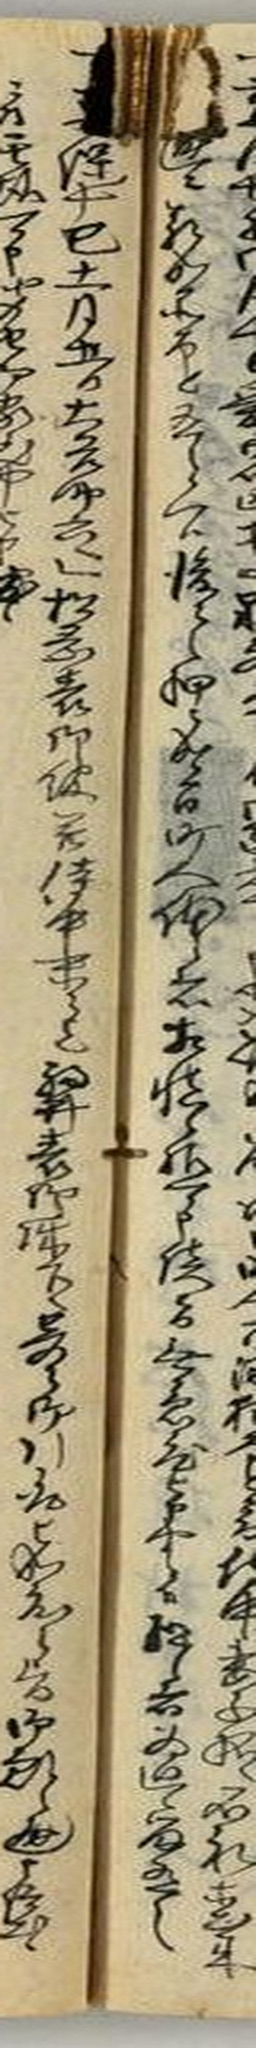一享保十巳十一月五日大谷助六へ」松岡表御館并侍中末々迄福井表御城下へ寄々御引取被成度之旨御願之通被仰出候
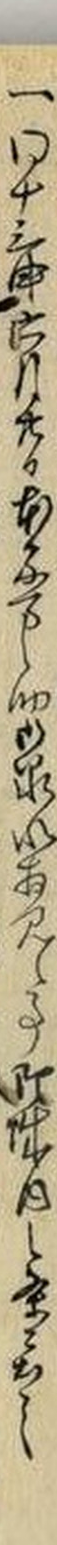一同十三申六月廿日本多万之助御泉水拝見之事御城内之条に出之
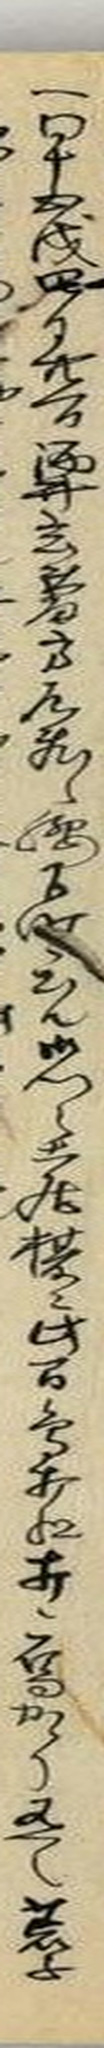一同十五戌四月廿一日酒井玄蕃方屋敷之腰下町へ出ル御門之土居榎に此間鳥打組打候烏かゝり有之荒子
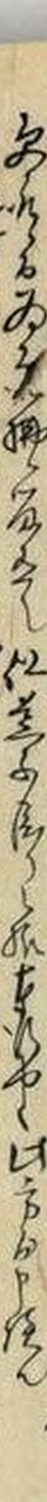受取候て為取払候留有之但荒子渡り候様奉行中へ此方ゟ申談ル
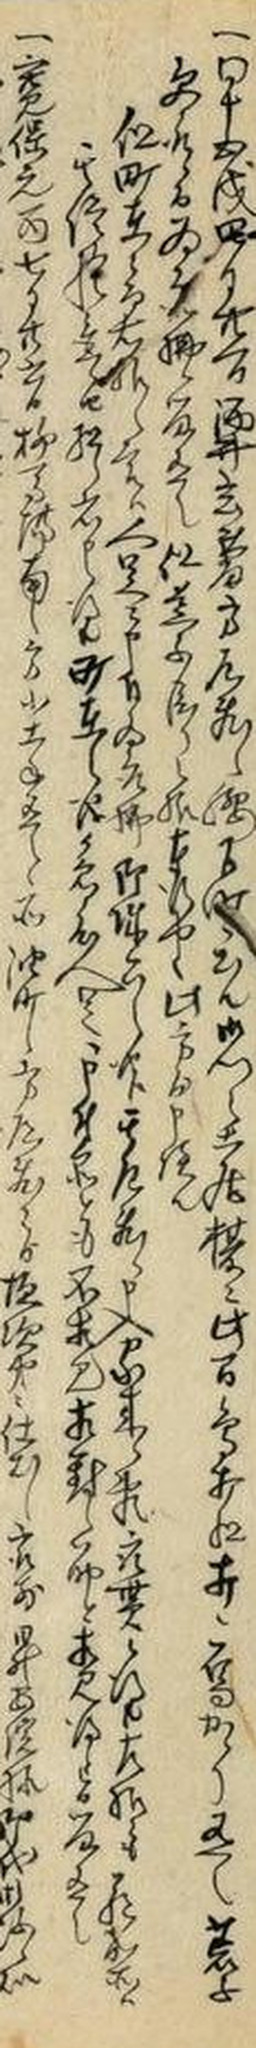但町在にて右様之節は人足に申付為取払御城下之儀は其屋敷へ申入家来へ頼取貰候得共左様にも難成所は
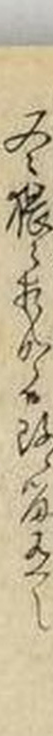又々猥に相成候付改候留有之
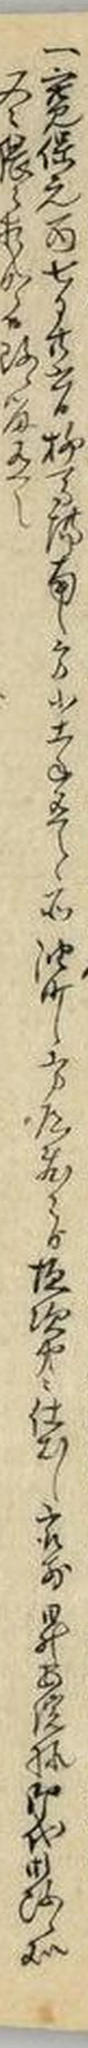一寛保元酉七月廿六日柳馬場南之方小土手有之候所油町之方屋敷々ゟ垣次第に仕出し最前昇安院様御代御改候処
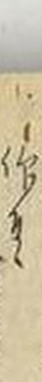仰付候
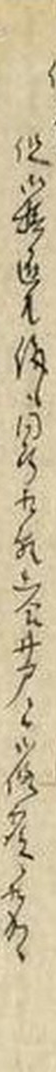但御膳匠共儀も同断相願出合井戸にて御修覆に相成候
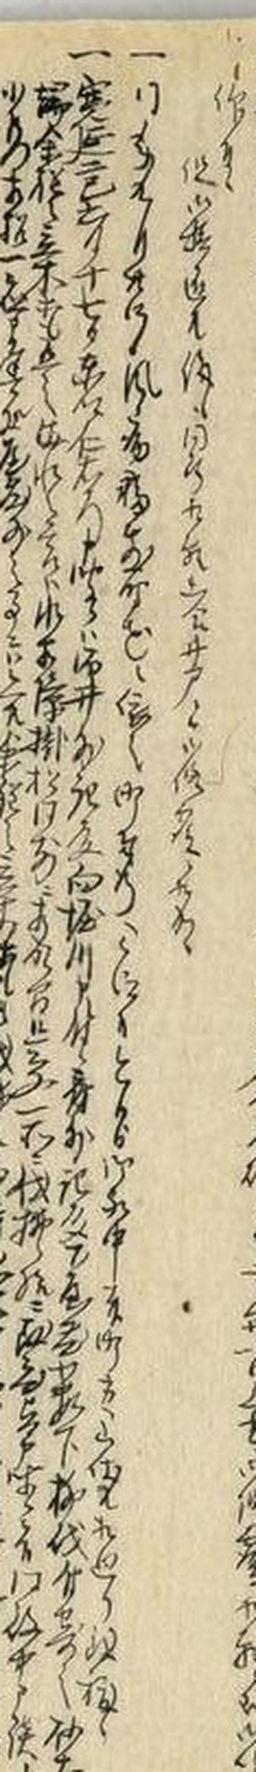一同年九月廿四日風病病盛時花候依之御奉行へ被仰付今日ゟ御家中并町方へ山伏共相廻り致祓候
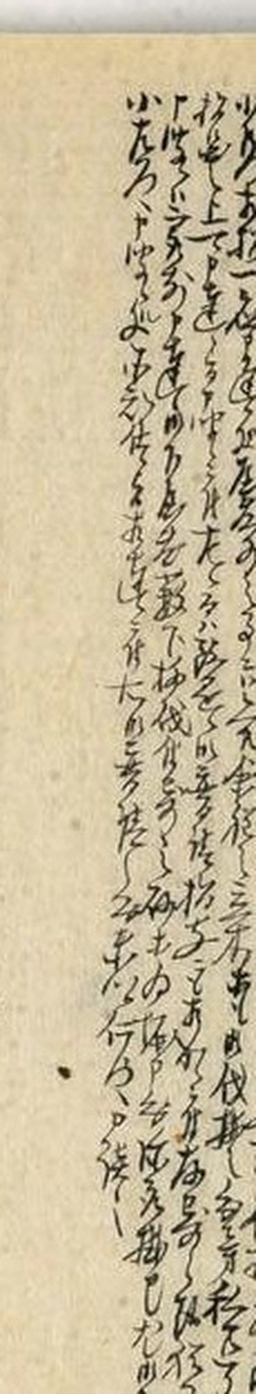小左衛門へ申聞候処承知仕候旨相達候に付右御普請之義東郷仁右衛門へ申談之
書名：御城下諸事之部
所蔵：福井県文書館 Fukui Prefectural Archives
